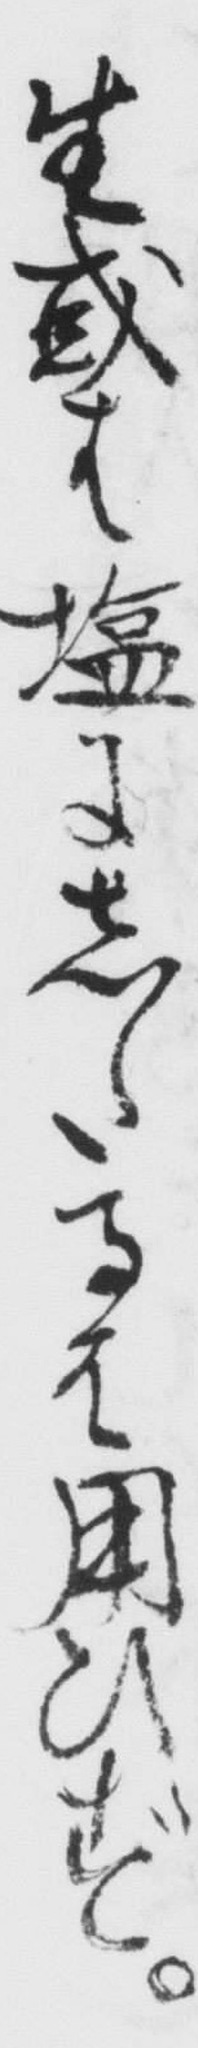生或は塩にしたるは用ひず。
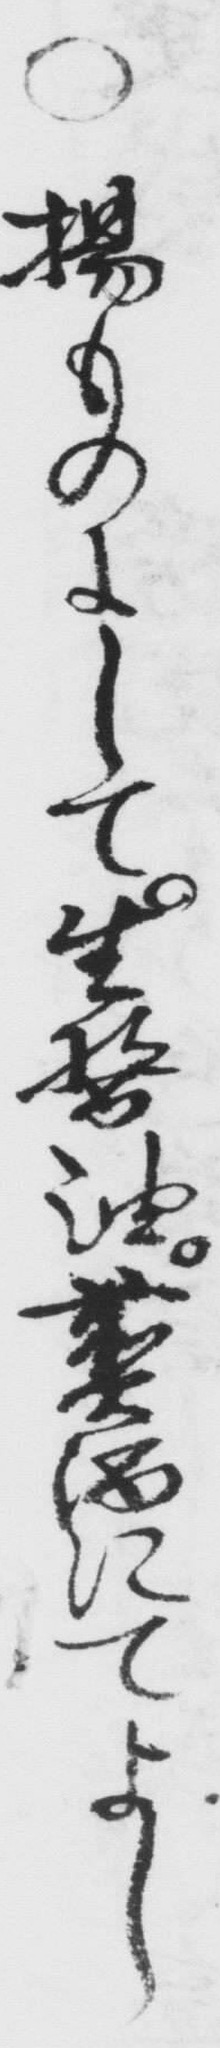○揚ものにして。生醤油。煎酒にてよし

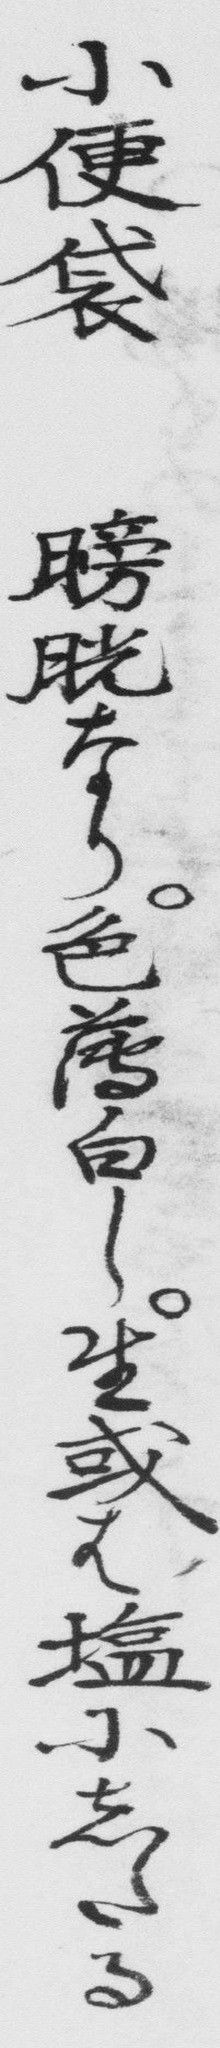小便袋膀胱なり。色薄白し。生或は塩にしたる
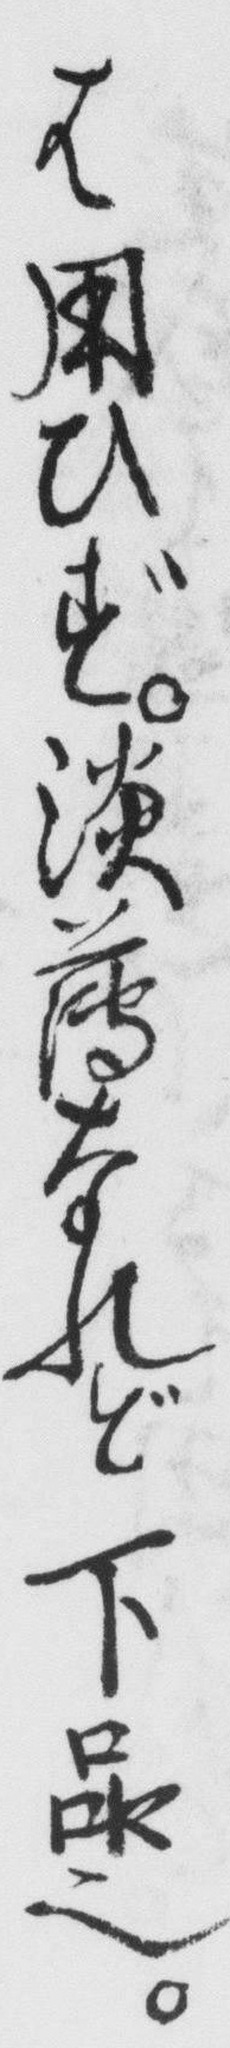は用ひず。淡薄なれど下品也。
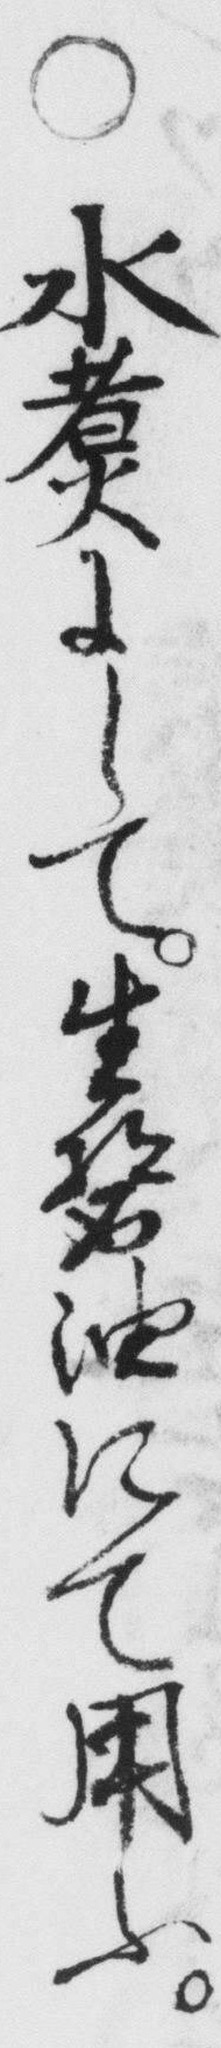○水煮にして。生醤油にて用ふ。
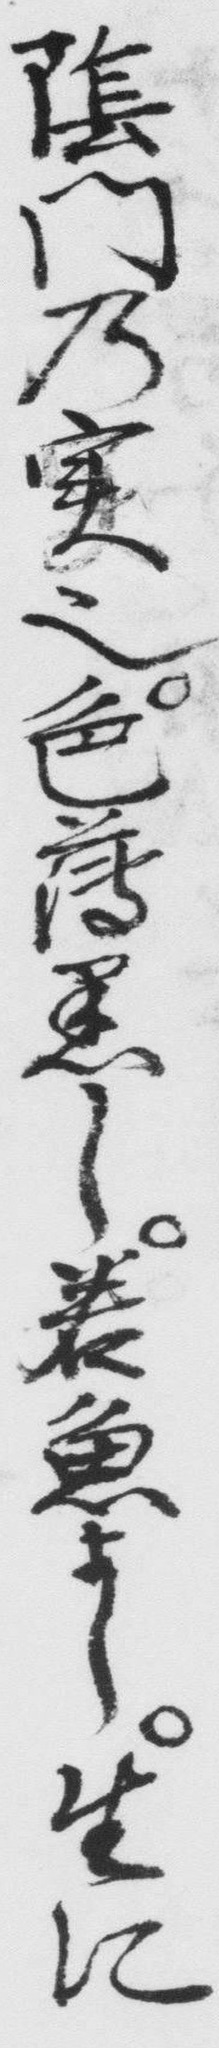ヒナ陰門の実也。色は薄黒し。若魚よし。生に
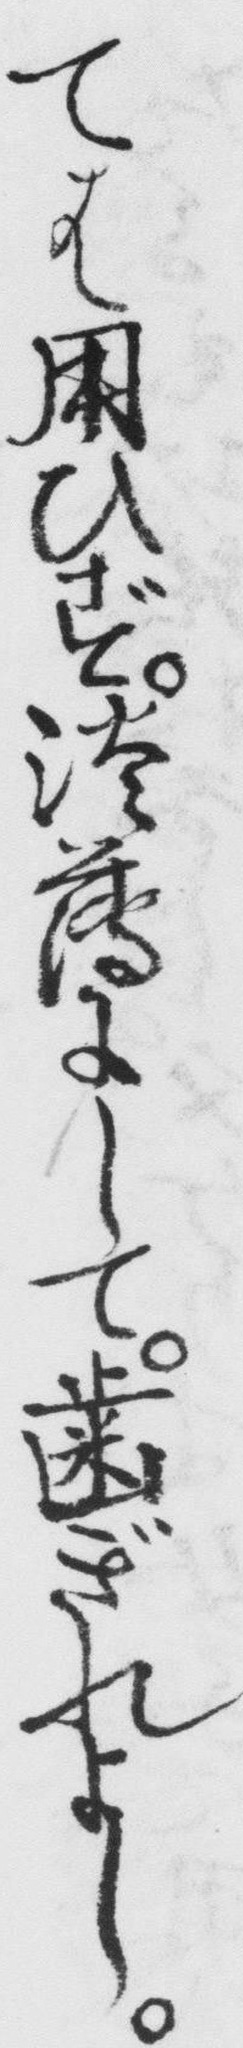ては用ひず。淡薄にして。歯ぎれよし。
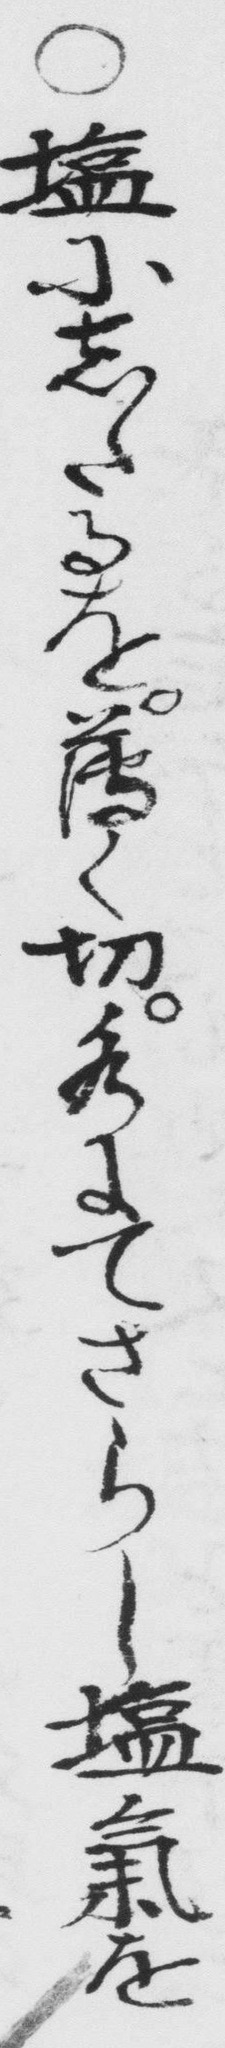○塩にしたるを。薄く切。水にてさらし塩気を
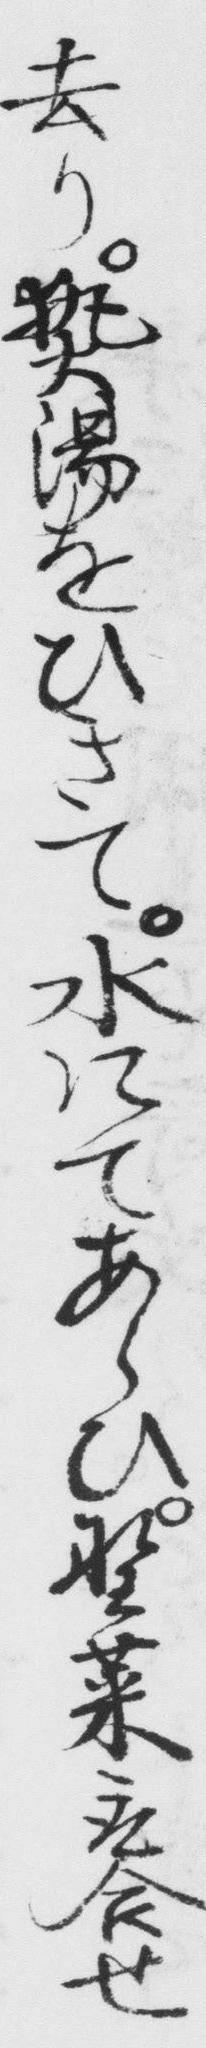去り。熱湯をひきて。水にてあらひ。野菜取合せ
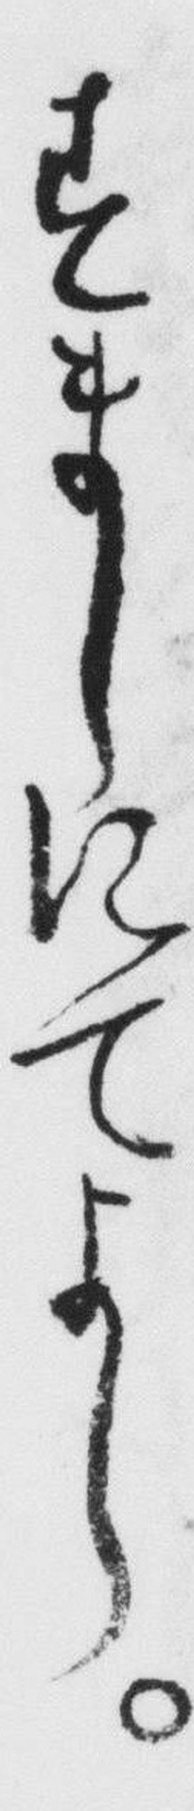すましにてよし。
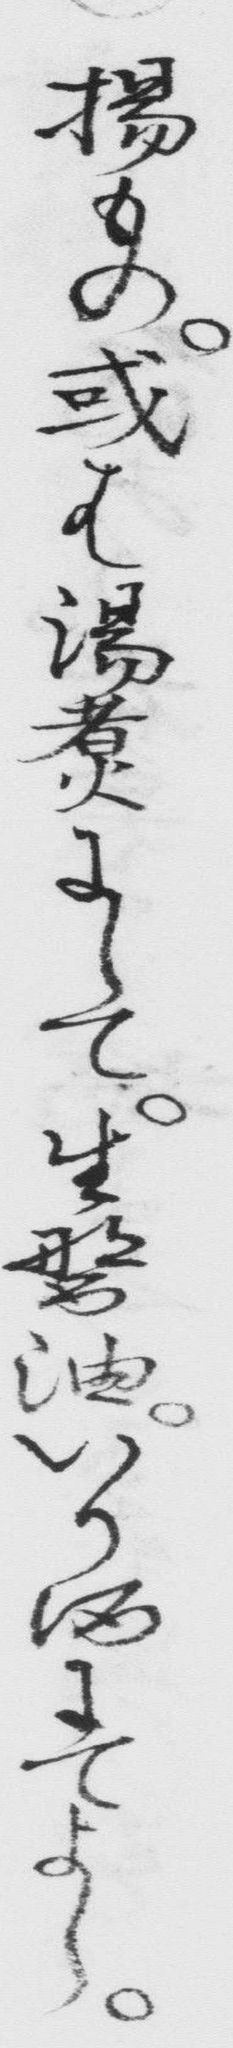○揚もの。或は湯煮にして。生醤油。いり酒にてよし。
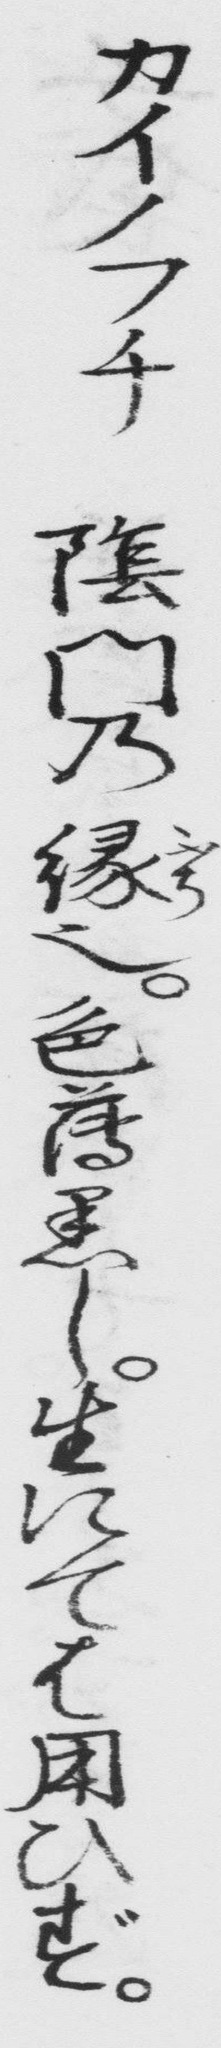カイノフチ陰門の縁也。色薄黒し。生にては用ひず。
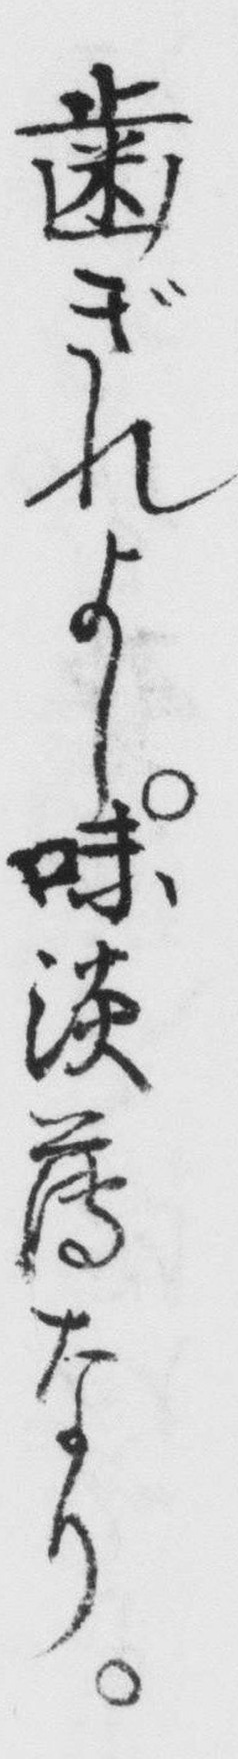歯ぎれよし。味淡薄なり。
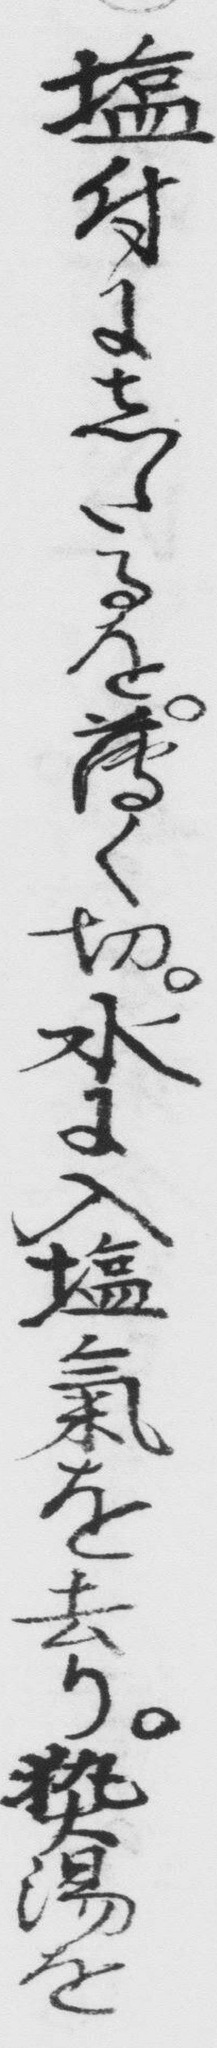○塩付にしたるを。薄く切。水に入塩気を去り。熱湯を
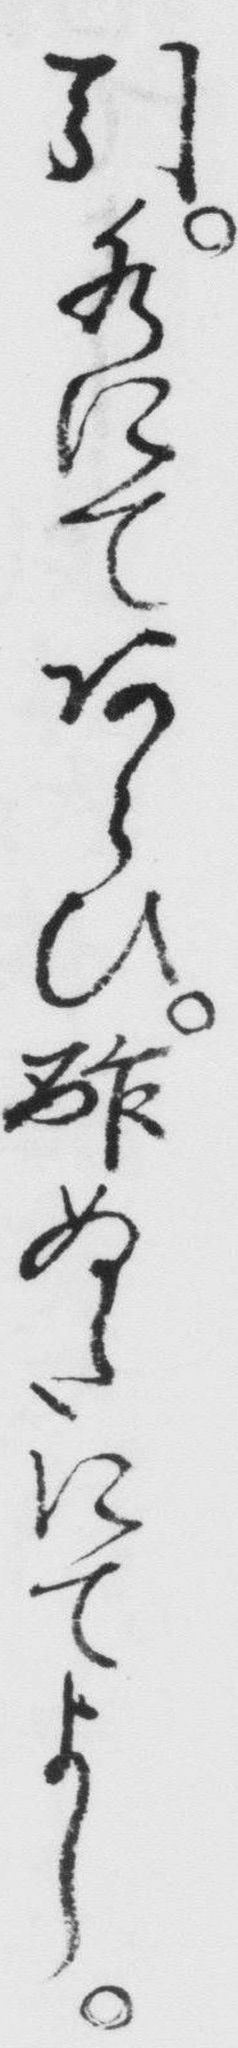引。水にてあらひ。酢ぬたにてよし。
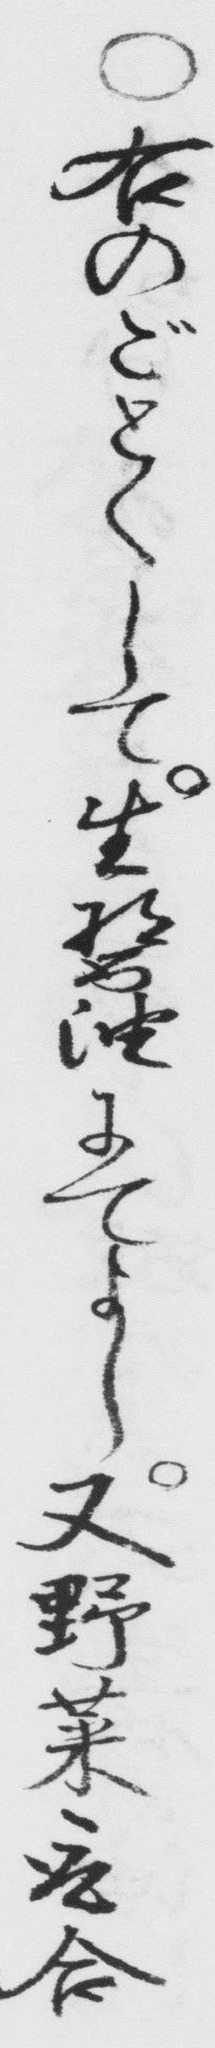○右のごとくして。生醤油にてよし。又野菜取合
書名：鯨肉調味方
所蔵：大阪府立大学学術情報センター 国文学研究資料館
